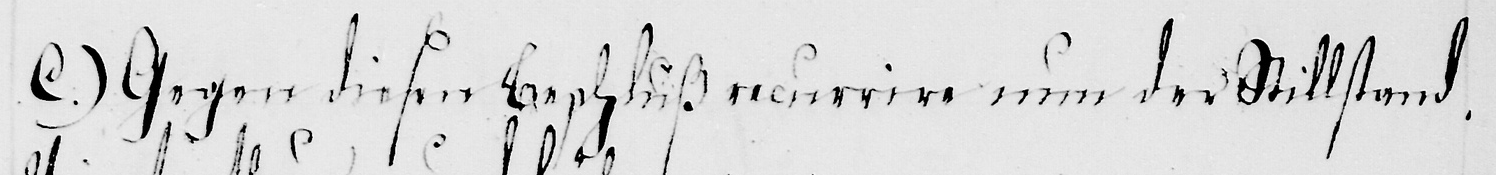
C.) Gegen diesen Beschluß recurrire nun der Stillstand
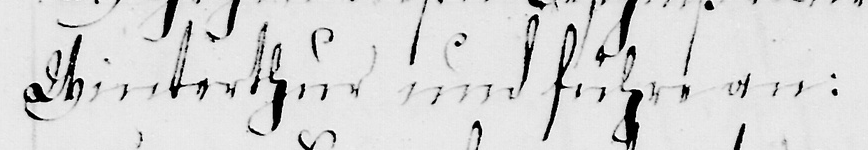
Winterthur und führe an:
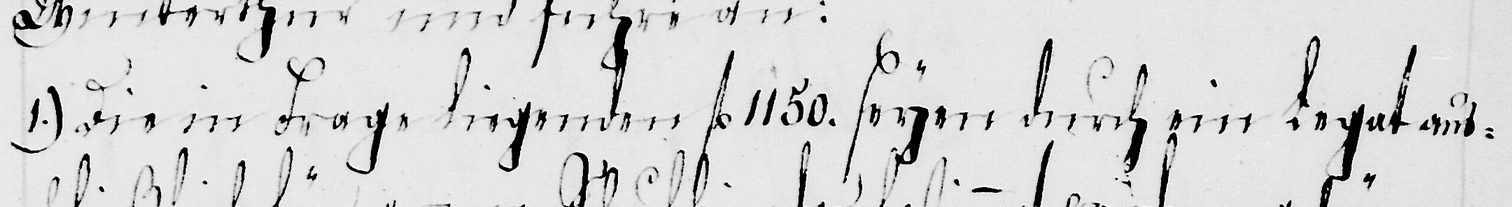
1.) Die in Frage liegenden fl. 1150. seyen durch ein Legat aus¬
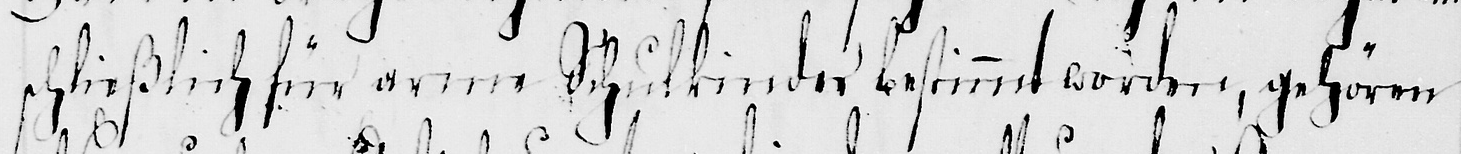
schließlich für arme Schulkinder bestimmt worden, gehören
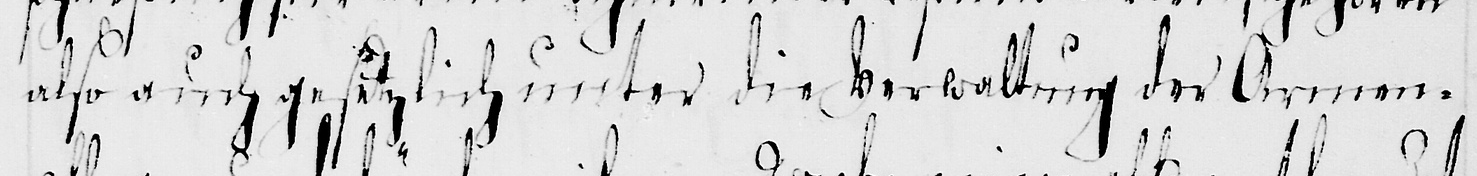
also auch gesetzlich unter die Verwaltung der Armen¬
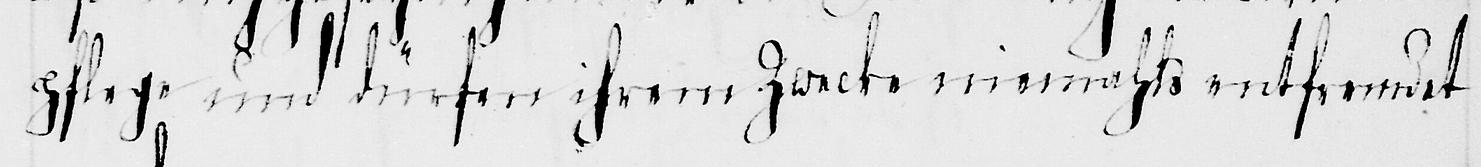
pflege und dürfen ihrem Zwecke niemahls entfremdet
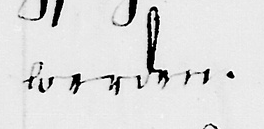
werden.
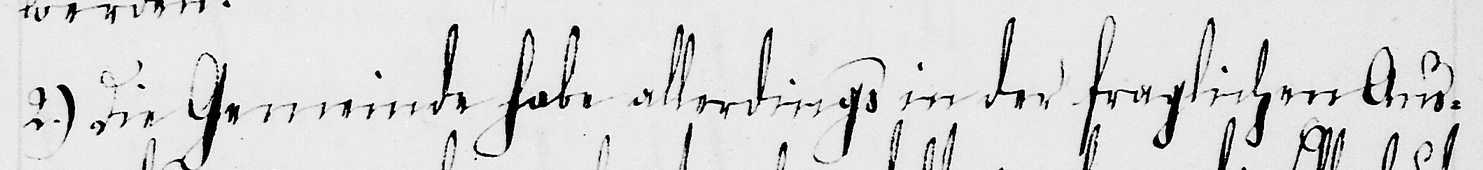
2.) Die Gemeinde habe allerdings in der fraglichen Aus¬
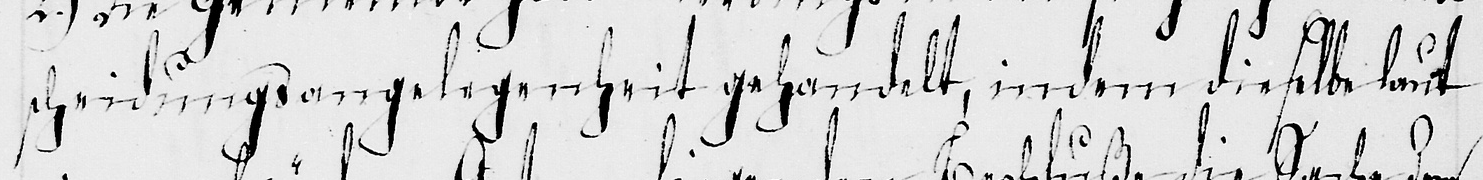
scheidungsangelegenheit gehandelt, indem dieselbe laut
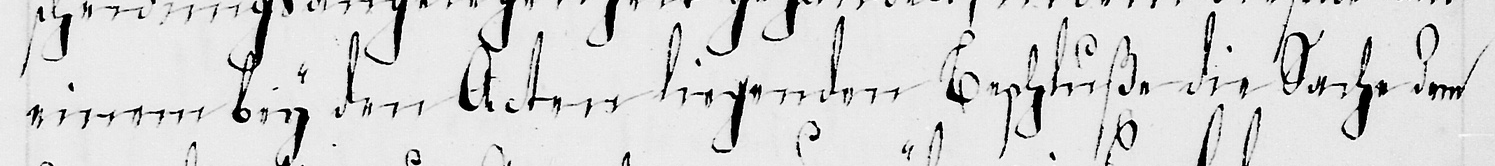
einem bey den Acten liegenden Beschluße die Sache dem
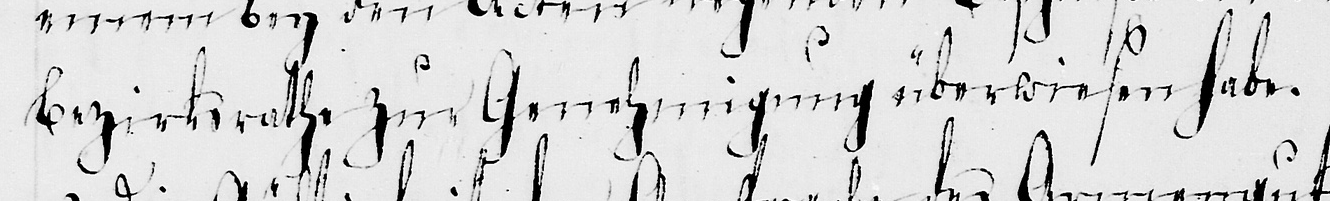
Bezirksrathe zur Genehmigung überwiesen habe.
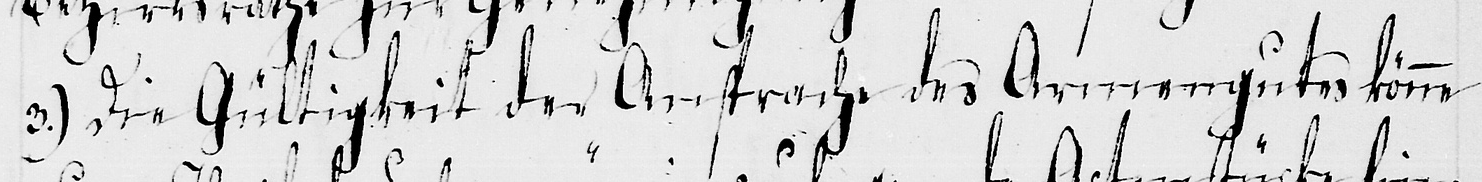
3.) Die Gültigkeit der Ansprache des Armengutes könne
